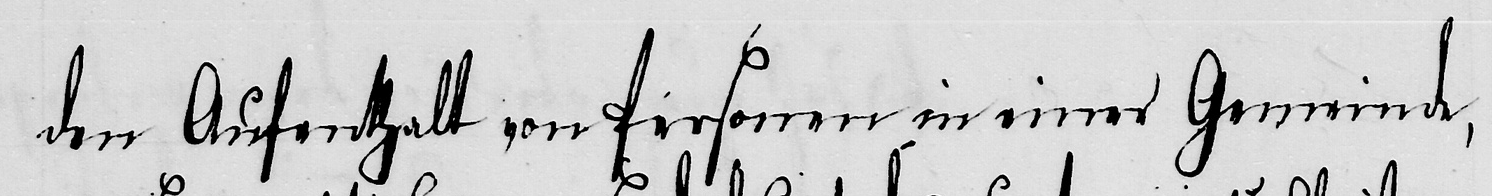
den Aufenthalt von Personen in einer Gemeinde,
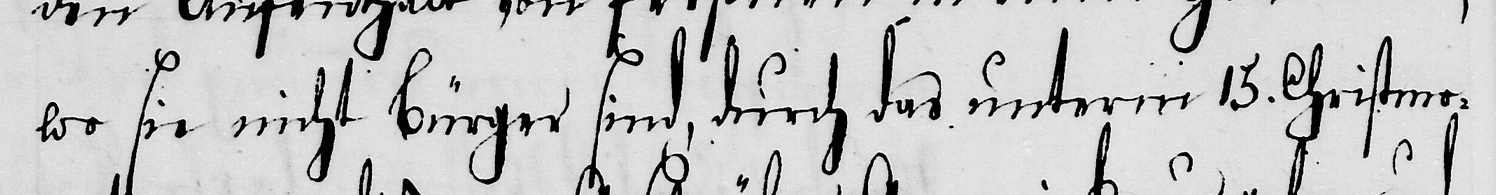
wo sie nicht Bürger sind, durch das unterm 15. Christmo¬
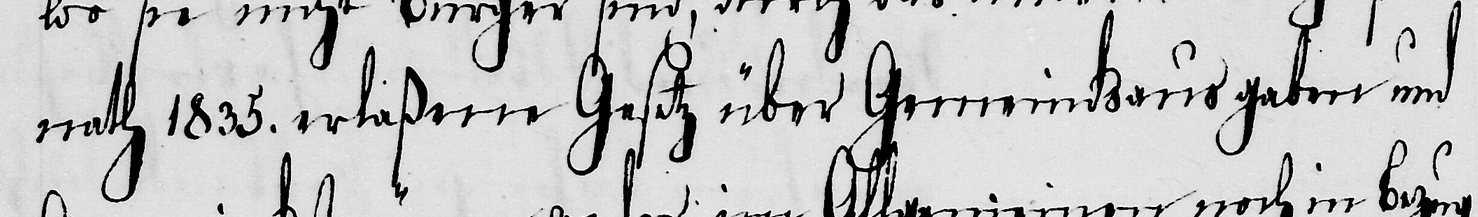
nath 1835. erlaßene Gesetz über Gemeindsausgaben und
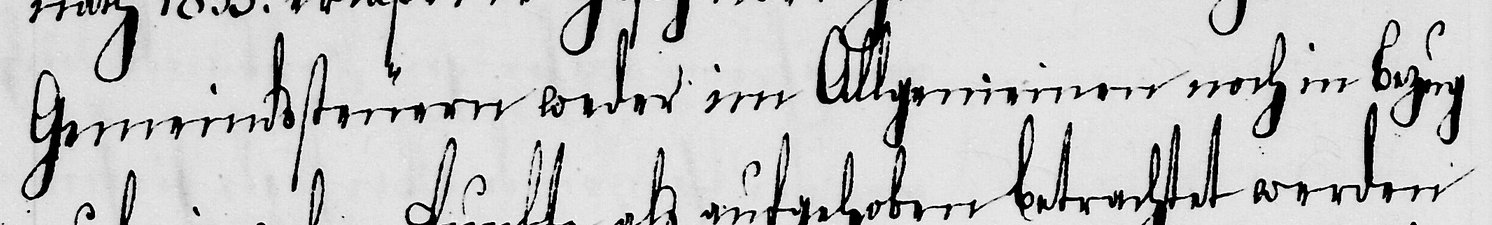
Gemeindssteuern weder im Allgemeinen noch in Bezug
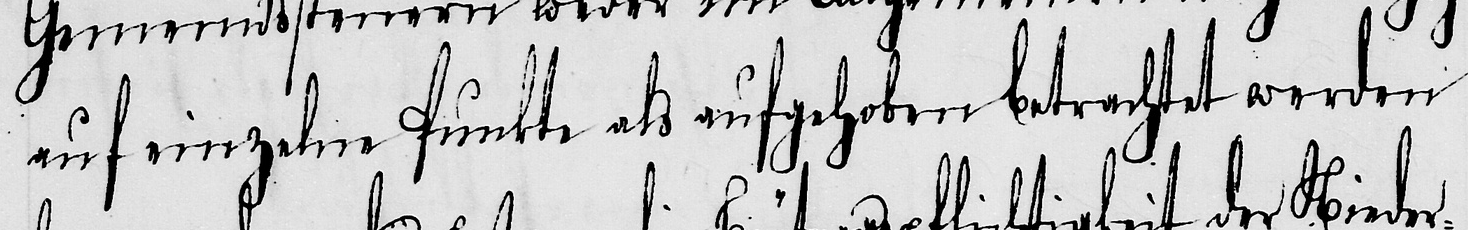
auf einzelne Punkte als aufgehoben betrachtet werden
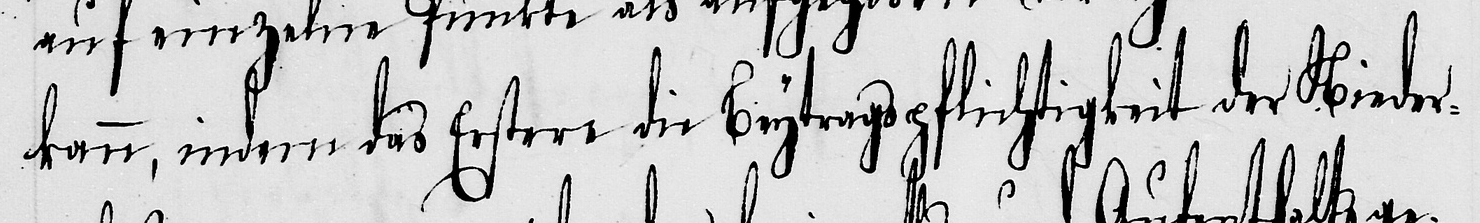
kann, indem das Erstere die Beytragspflichtigkeit der Nieder¬
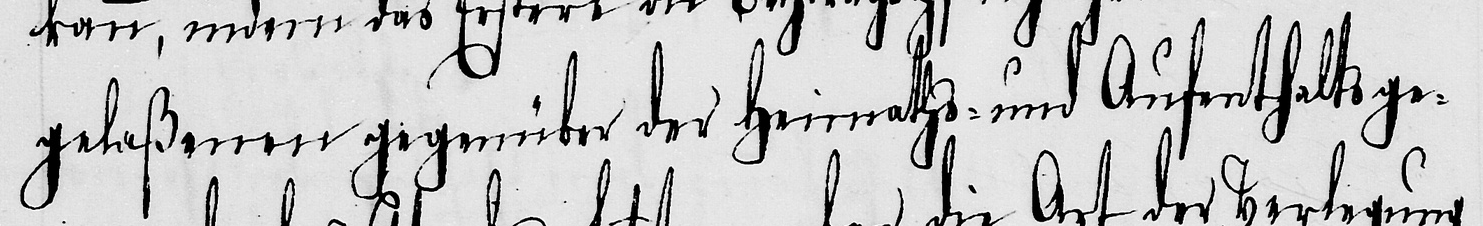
gelaßenen gegenüber der Heimaths- und Aufenthaltsge¬
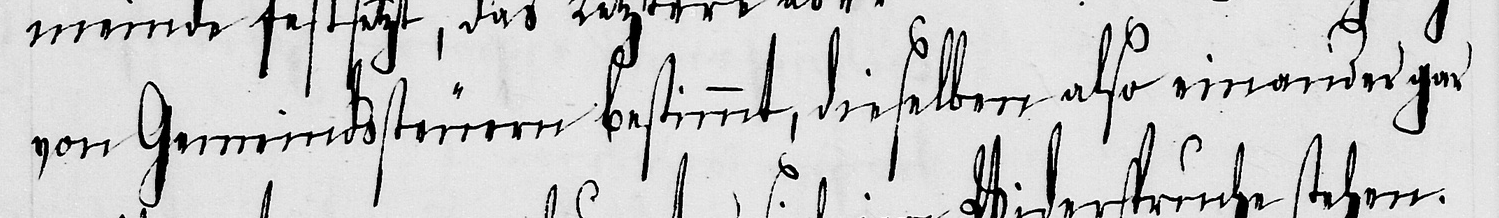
von Gemeindssteuern bestimmt, dieselben also einander gar
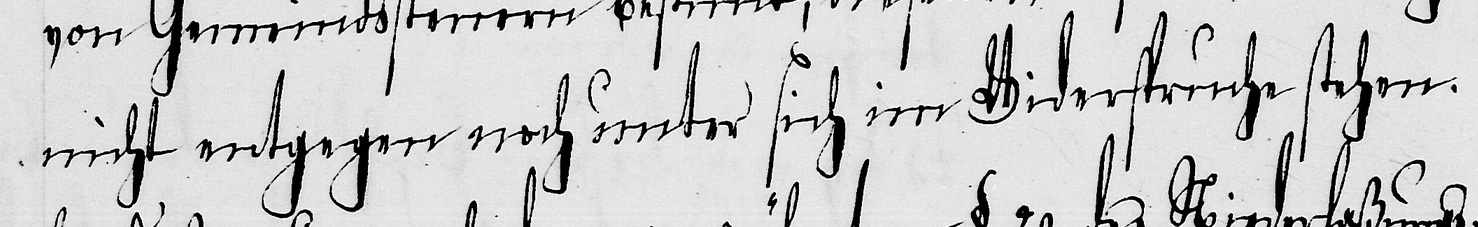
nicht entgegen noch unter sich in Widerspruche stehen.
